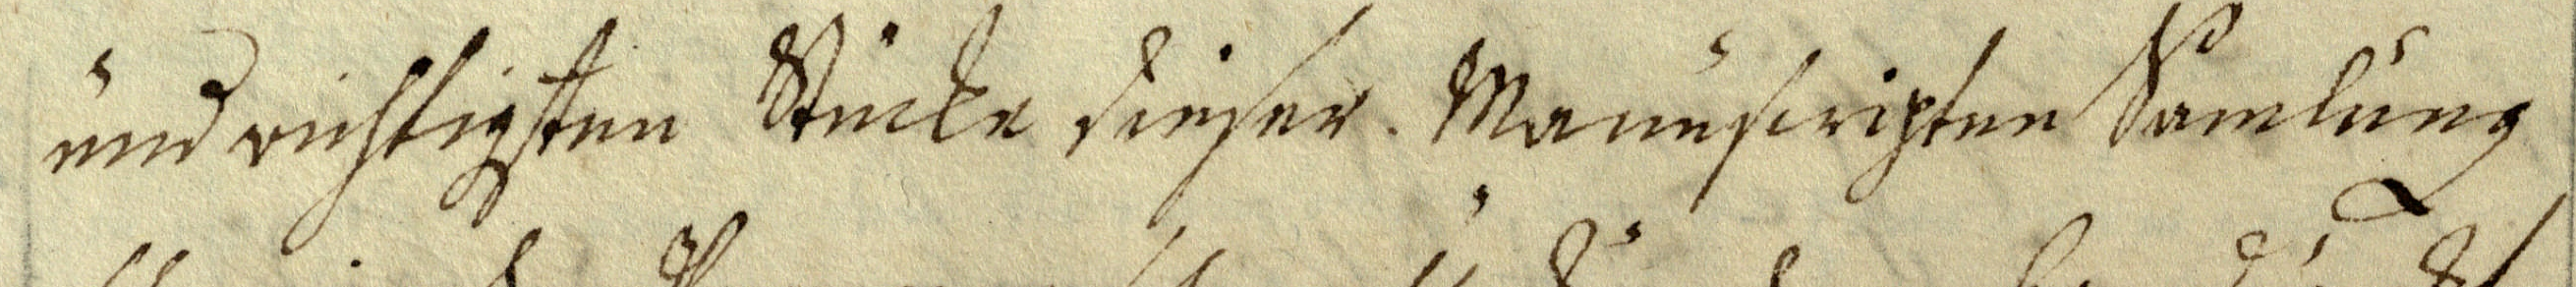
und wichtigsten Stücke dieser Manuskripten Samlung
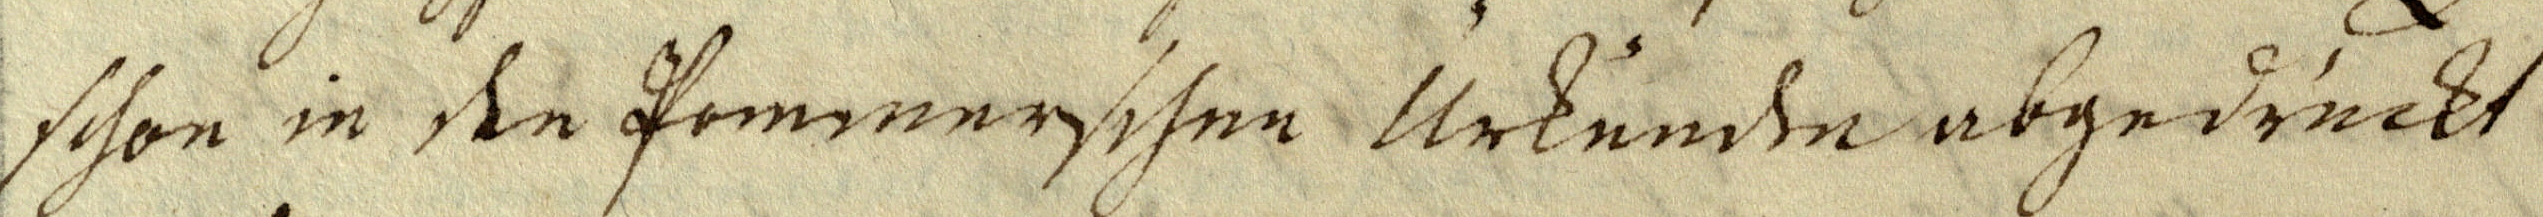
schon in den Pommerschen Urkunden abgedruckt
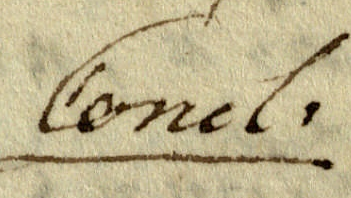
Concl.
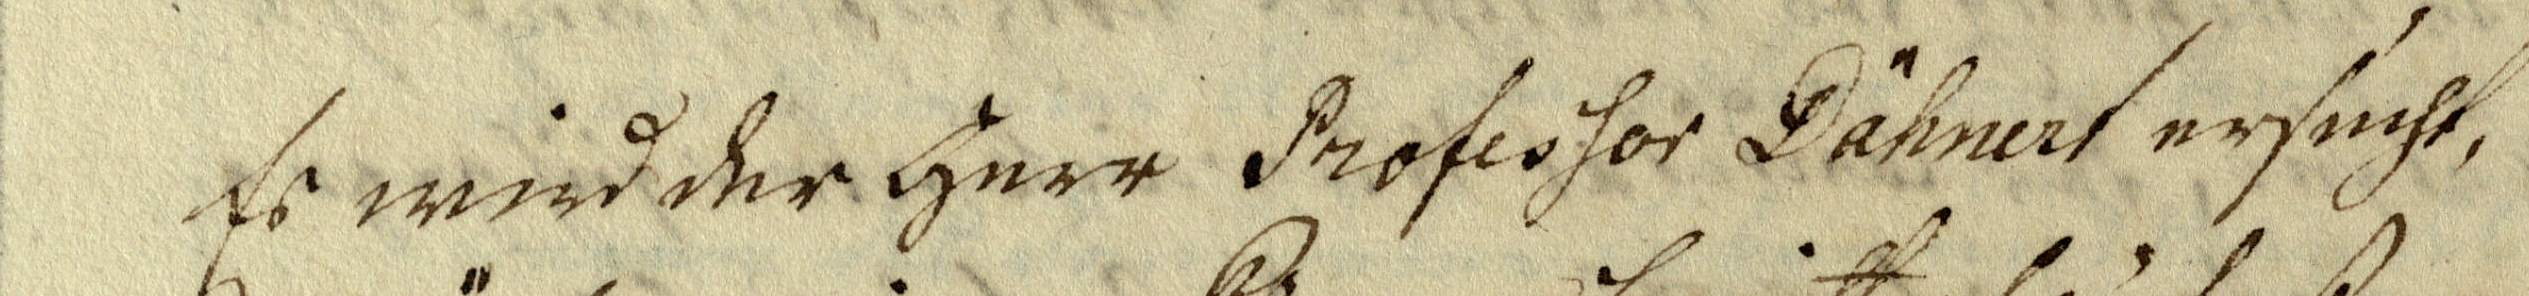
Es wird der Herr Professor Dähnert ersucht,
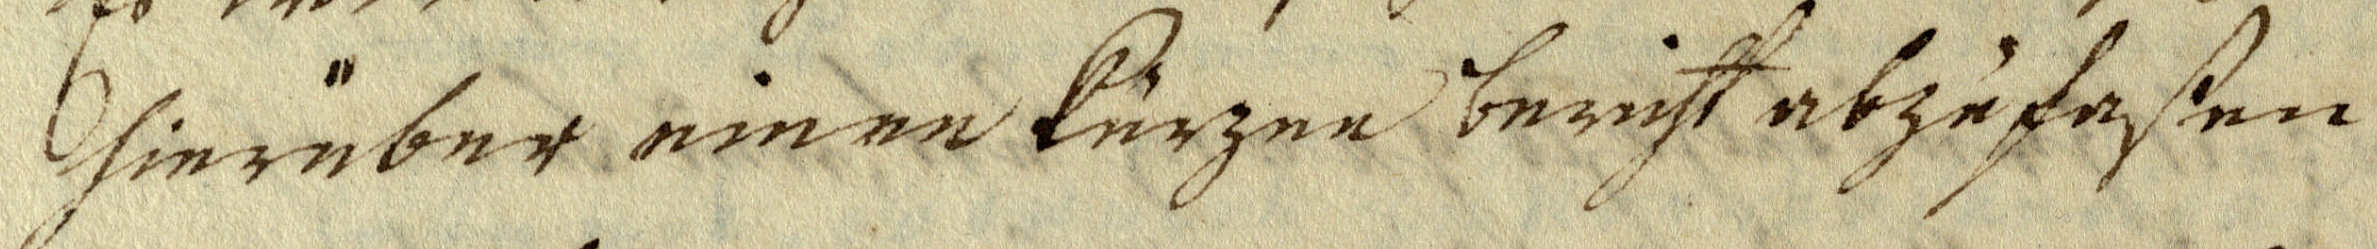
hierüber einen kurzen Bericht abzufaßen.
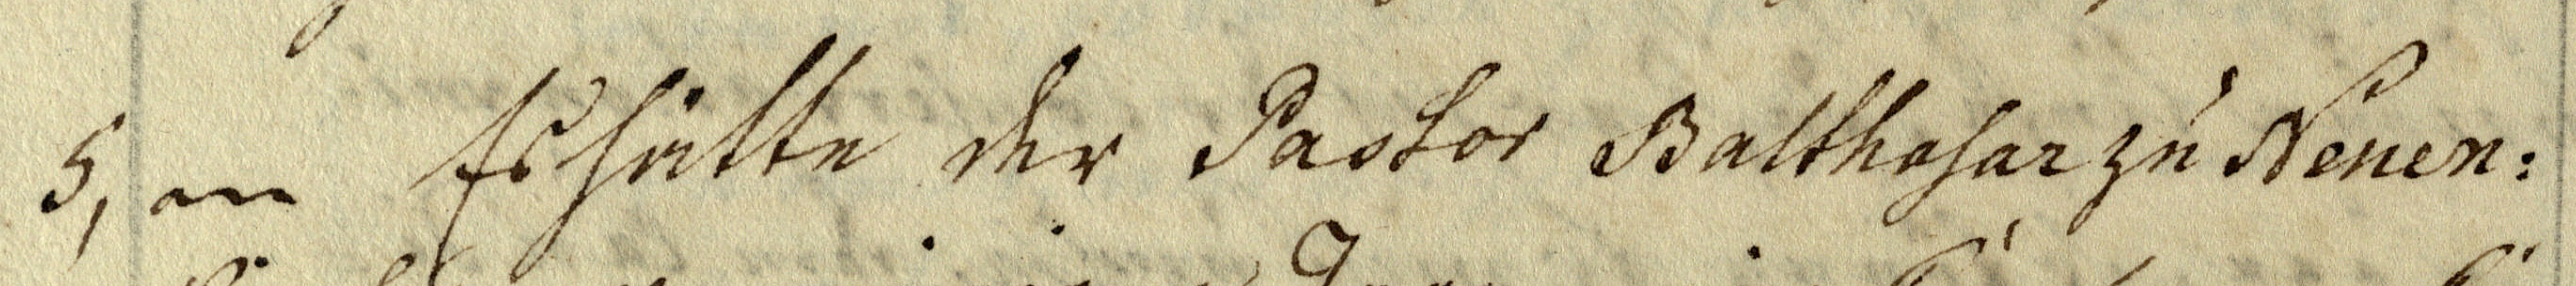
5, Es hätte der Pastor Balthasar zu Neuen¬
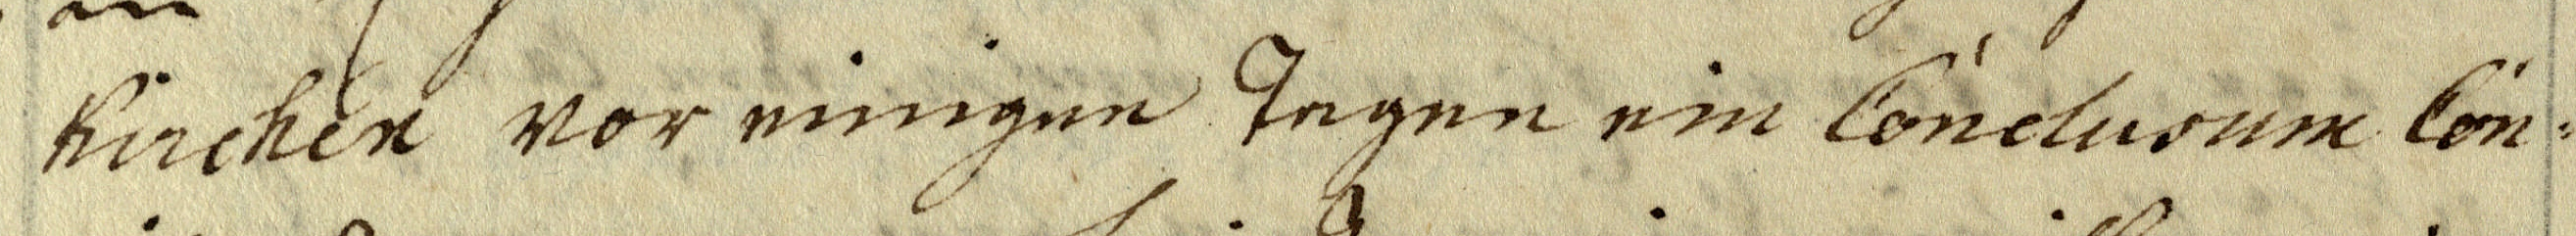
kirchen vor einigen Tagen ein Conclusum Con¬
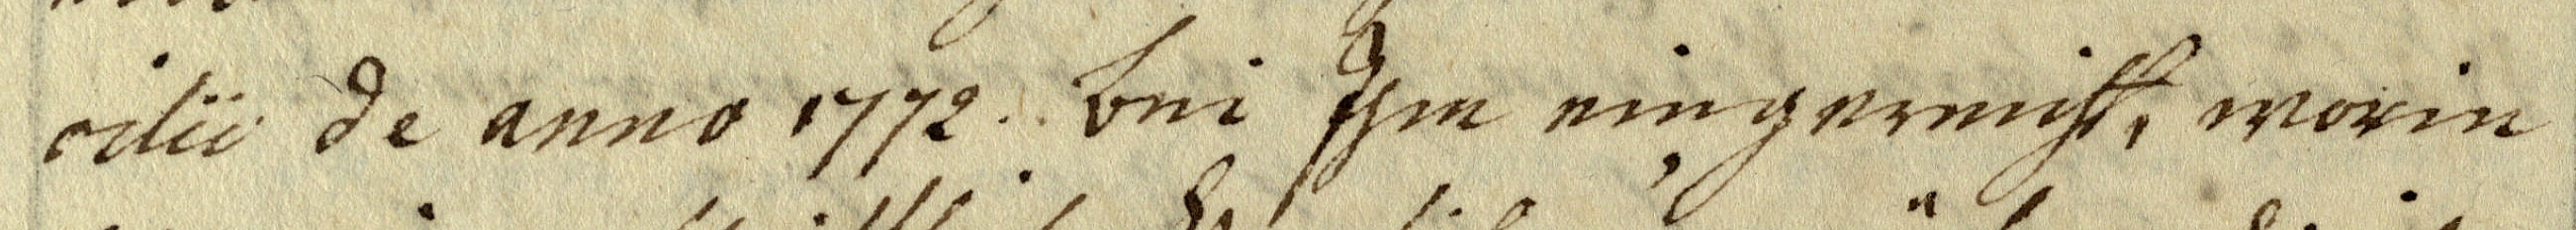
cilii de anno 1772. bei Ihm eingereicht, worin
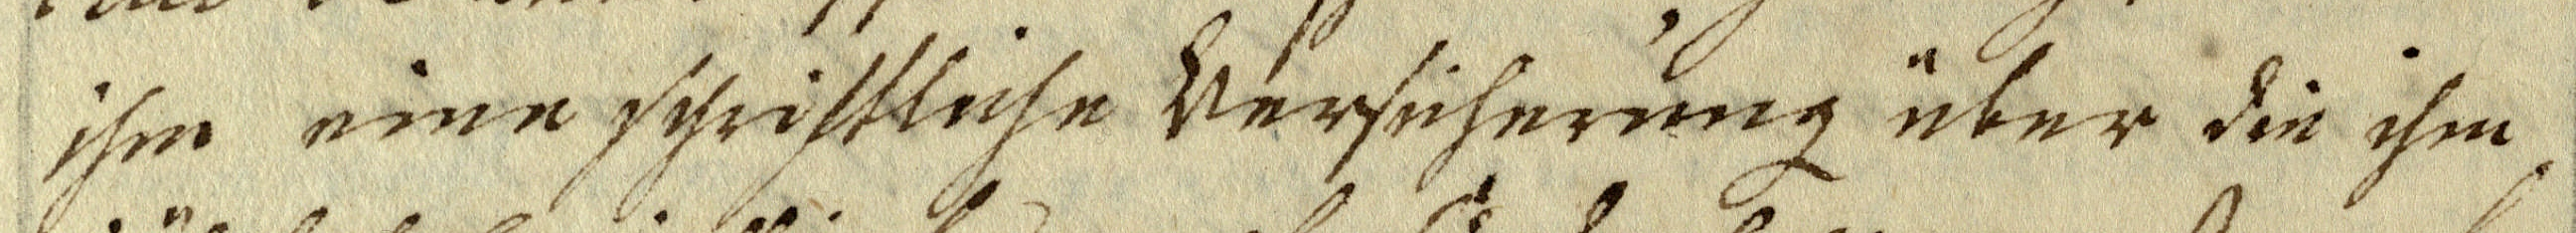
ihm eine schriftliche Versicherung über die ihm
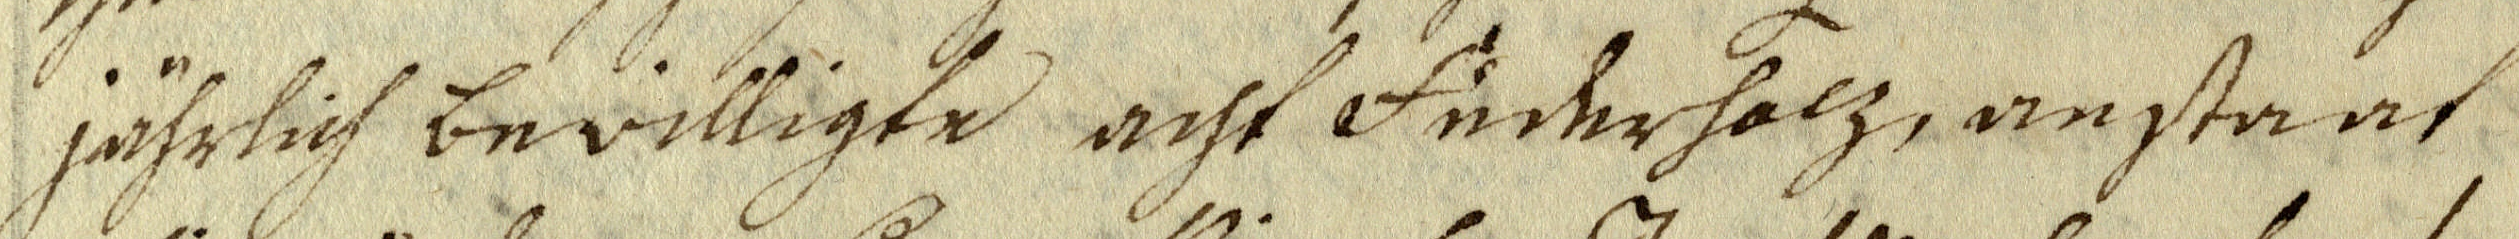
jährlich bewilligte acht Fuder Holz, anstaat
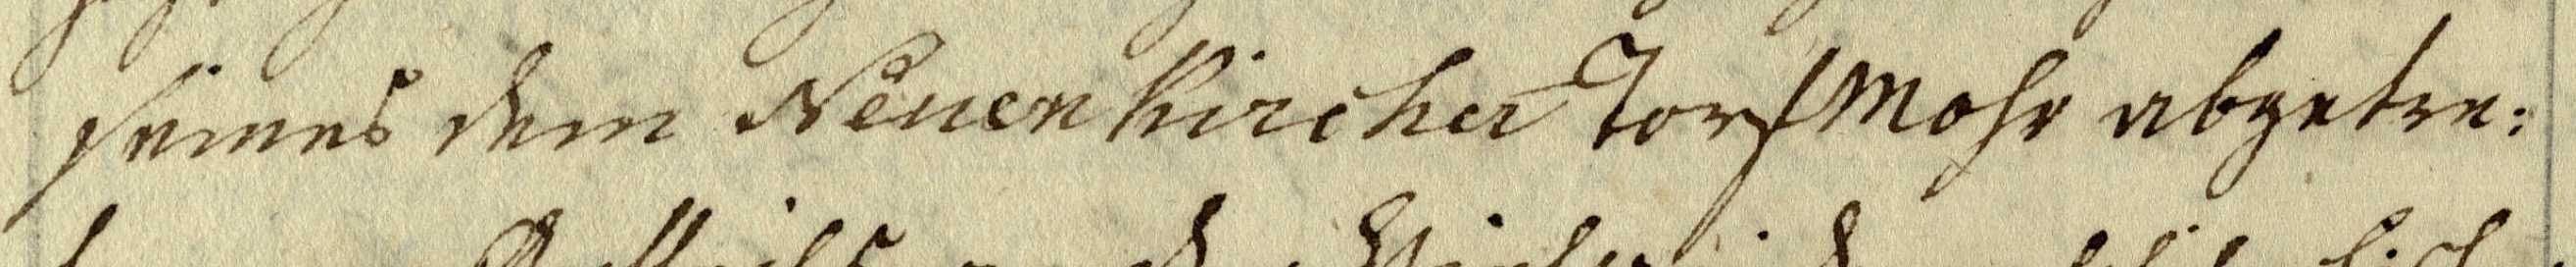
seines dem Neuenkircher Torfmohr abgetre¬
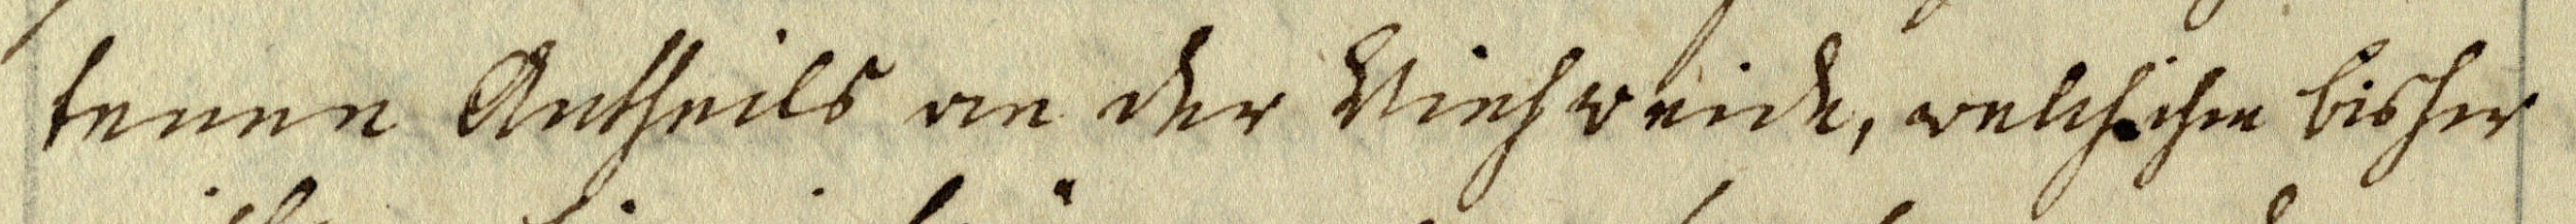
tenen Antheils an der Viehweide, welchen bisher
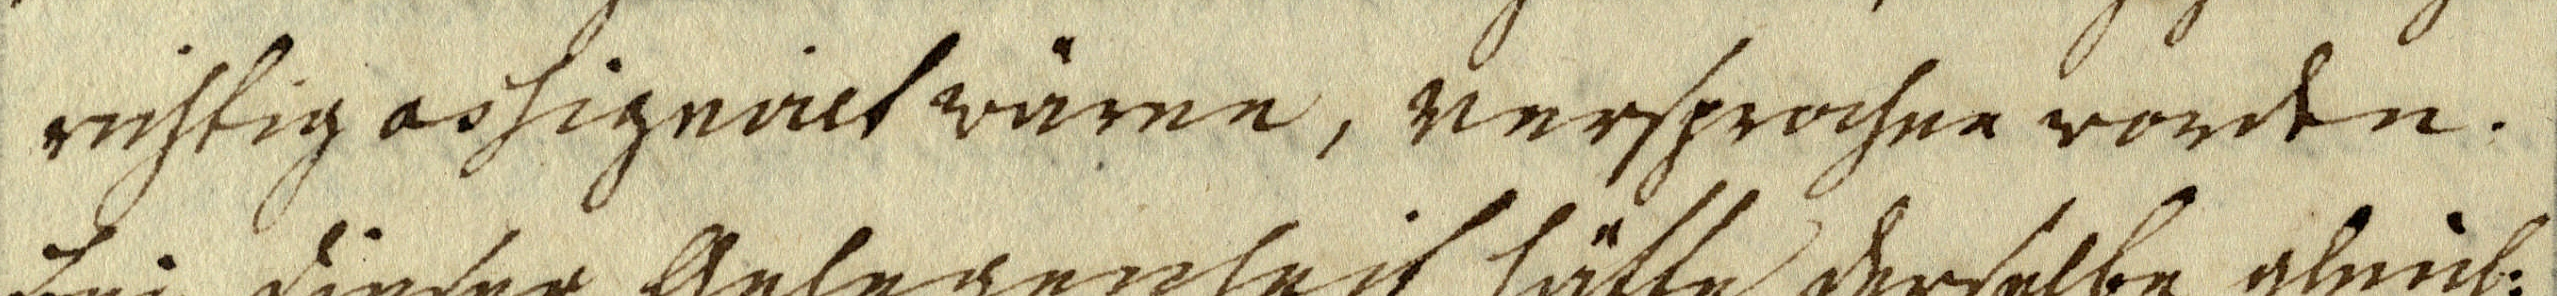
richtig assigniret wären, versprochen worden.
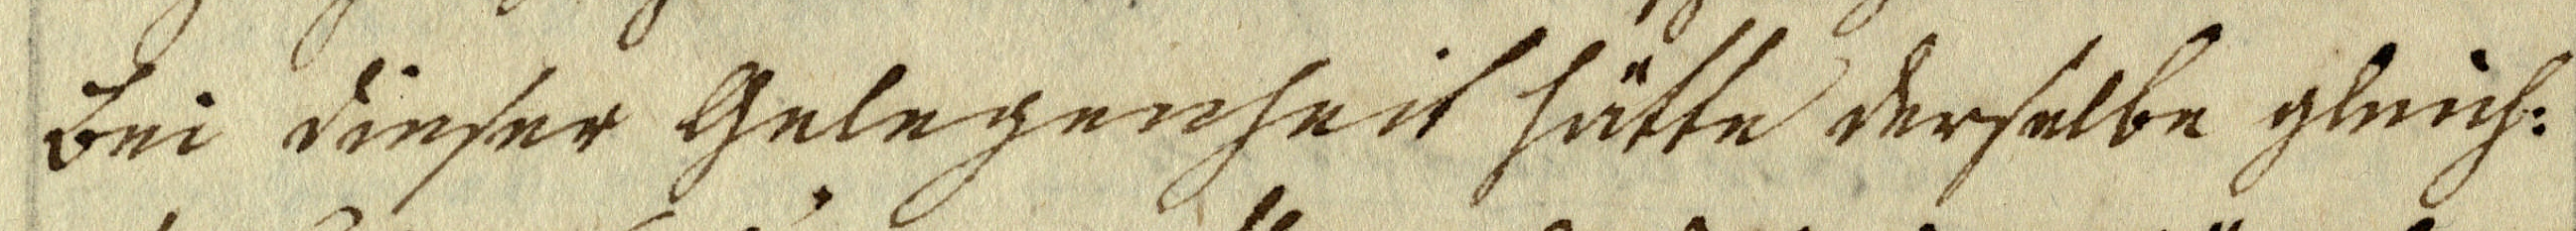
Bei dieser Gelegenheit hätte derselbe gleich¬
